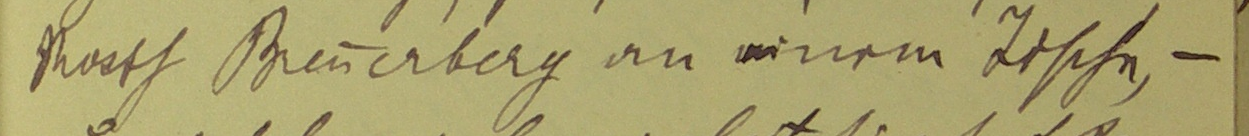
Noth. Beuerberg an einem Tisch, -
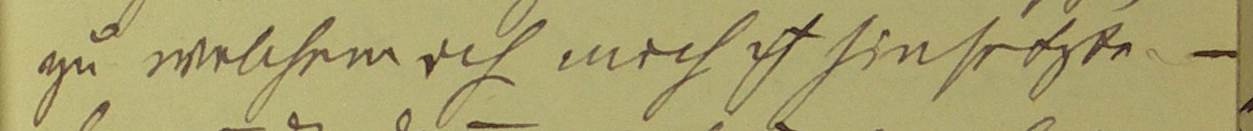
zu welchen ich mich auch hinsetzte.
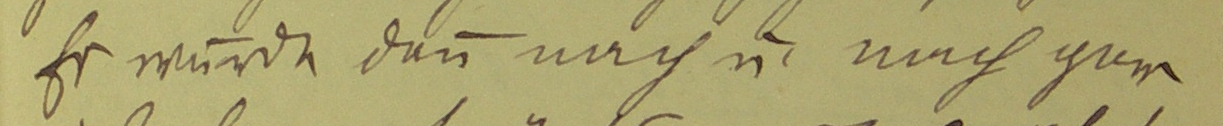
Es wurde dann nach und nach gar
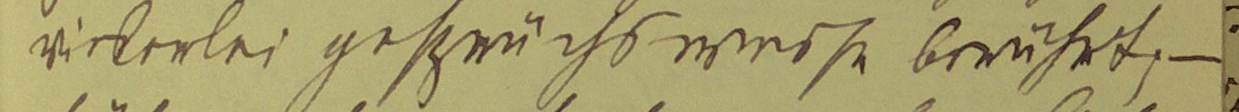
vielerlei gesprächsweise berührt,-
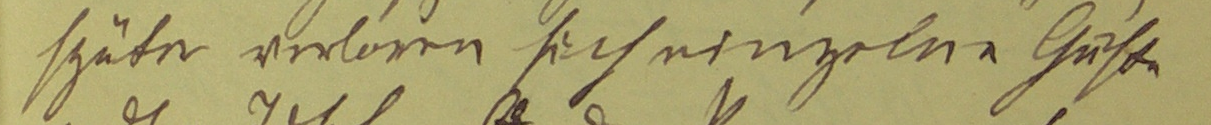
später verloren sich einzelne Gäste
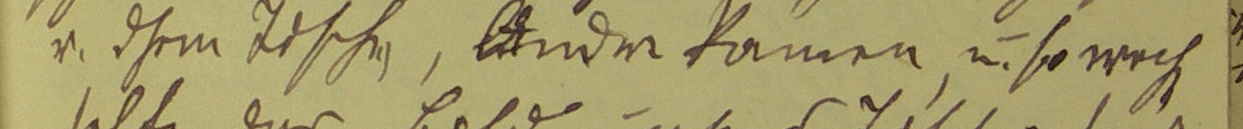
von diesem Tisch, andere kamen und so wech¬
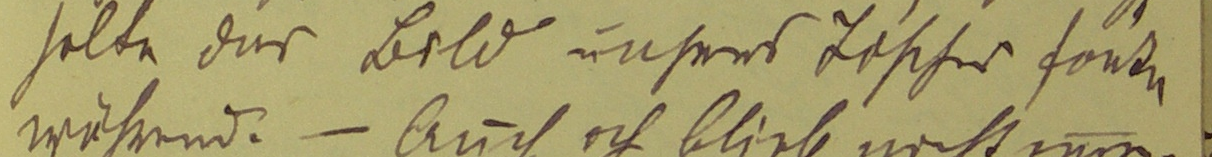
selte das Bild unseres Tisches fort¬
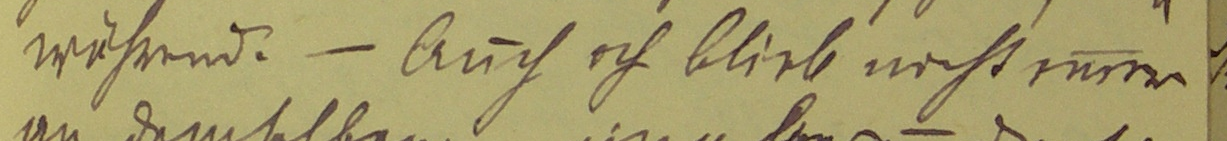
während.- Auch ich blieb nicht immer
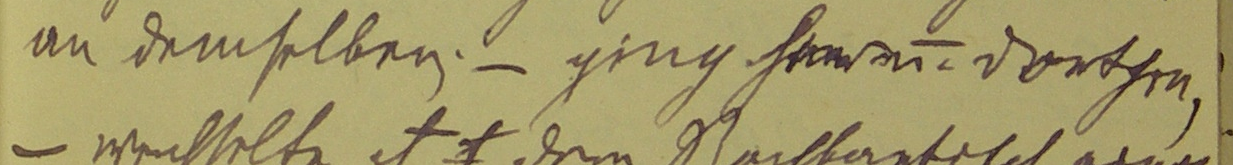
an demselben. –Ging hinaus und.dorthin,
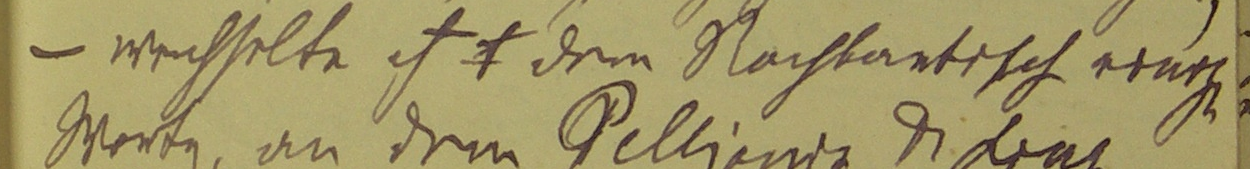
- wechselte mit den Nachbartisch einige
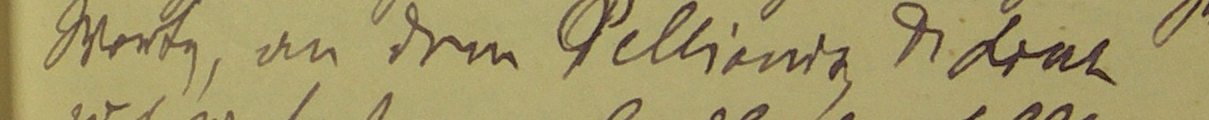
Worte,an dem Pelliani, Dr. Lenz
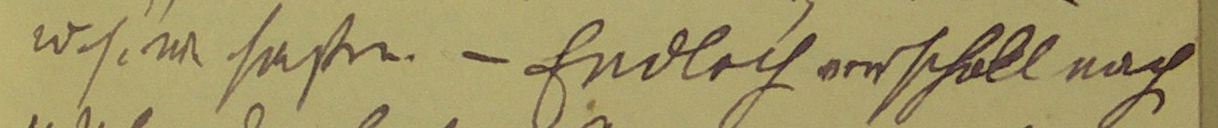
u.s.w. saßen.- Endlich erschall nach
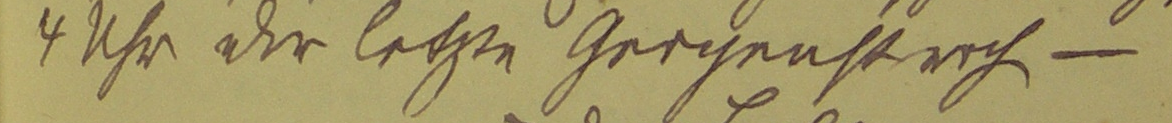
4 Uhr der letzte ?Geigenstrich-
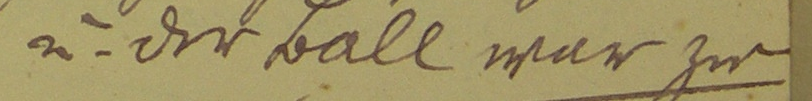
und der Ball war zur
